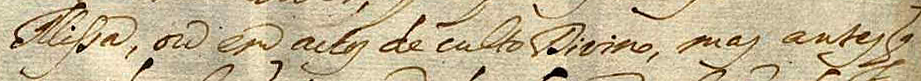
Missa, ou em actos de culto Divino, mas antes q̄
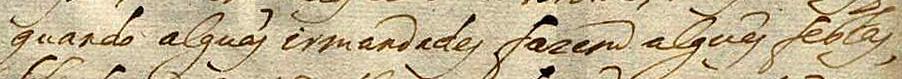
quando alguās irmandades fazem alguās festas,
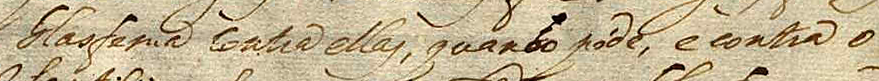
blasfema contra ellas, quanto póde, e contra o
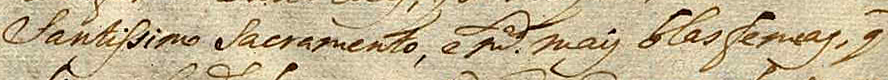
Santissimo Sacramento, e m.tas mais blasfemas, q̄
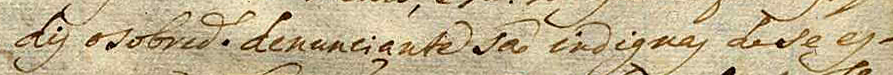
dis o sobred.o denunciante saõ indignas de se es
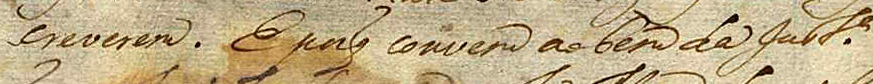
creverem. E porq̄ convem ao bem da Just.a
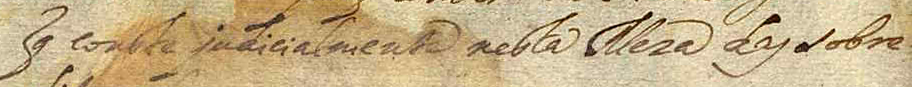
q̄ conste judicialmente nesta Meza das sobre
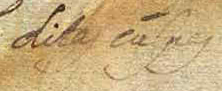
ditas culpas
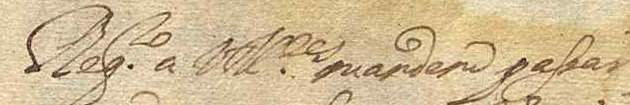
Req.ro a V M.ces mandem passar
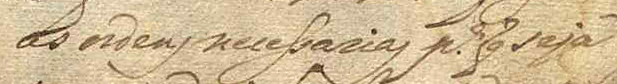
as ordens necessarias p.a q̄ seja
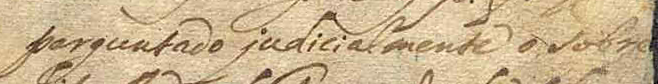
perguntado judicialmente o sobre
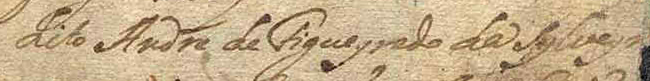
dito Andre de Figueyredo da Sylveyr
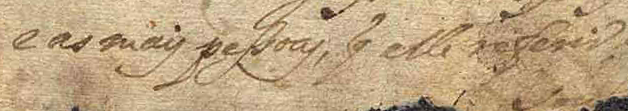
e as mais pessoas, q̄ elle referir,
